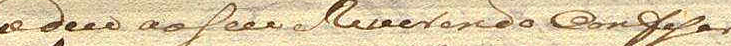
o deu ao seu Reverendo Confesor
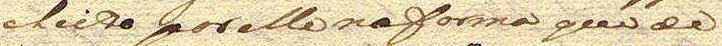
eleito por elle na forma que de
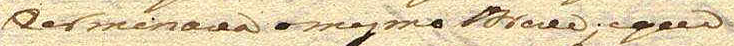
terminava o mesmo Breve; e que
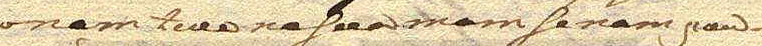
o nam teve na sua mam senam pou
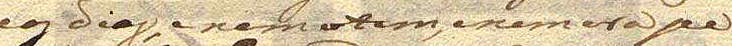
cos dias, e nem o tem, e nem era pe
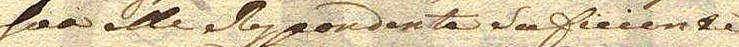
soa elle e Respondenta suficiente
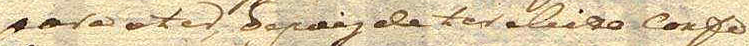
para a ter, depois de ter eleito confe
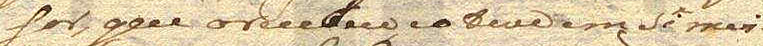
sor, que a recebece, e o teve em si miu
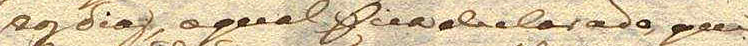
tos dias, o qual fica declarado, que
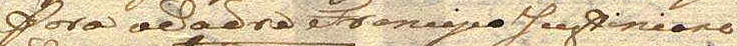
fora o Padre Francisco Justiniano
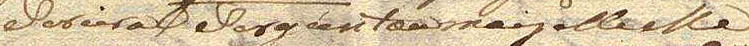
Pereira ? Perguntou mais elle ME
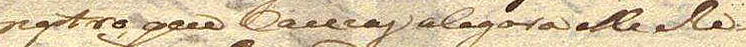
nistro, que Couzas elegera elle Re
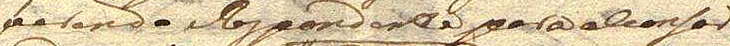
verendo Respodente para alcansar
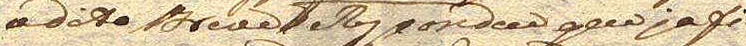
o dito Breve ? Repondeu que ja fi
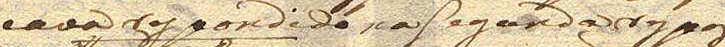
cava respondido na segunda respos
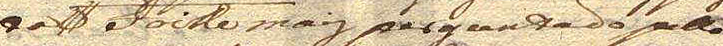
ta ? Foilhe mais perguntado pello
